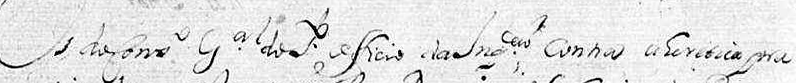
Os do Conso G.al do S.to officio da Inq.çaõ contra a heretica pra
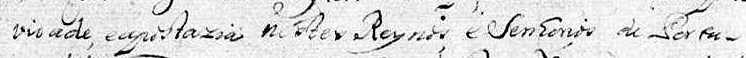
vidade, e apostazia nestes Reynos e Senhorios de Portu
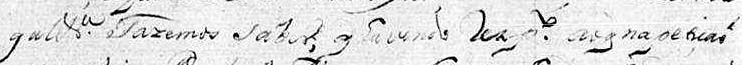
gal &a. Fazemos saber, q̄ hauendo Resp.o em q na petiçaõ
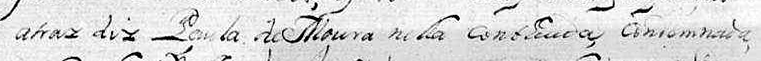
atraz diz Paula de Moura nella contheuda, condemnada
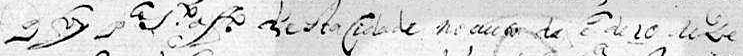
foy plo S.to off.o desta Cidde no auto da Fé de 10 de De
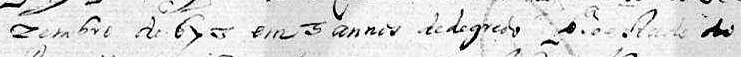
zembro de 670 em 3 annos de degredo p.a o Reino do
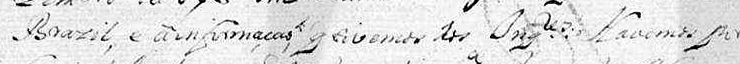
Brazil, e a informaçaõ q tivemos dos Inq.res Hauemos por
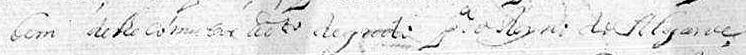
bem de lhe comutar heste degredo p.a o Reyno do Algarue
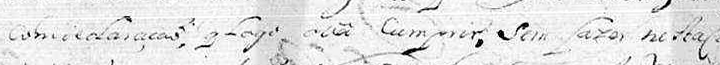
com declaraçaõ, q logo auer cumprir, sem fazer nesta Ci
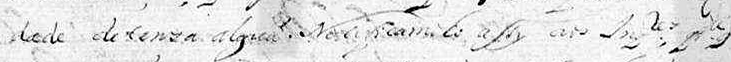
dade detensa alguā. Notificamdo assy nos Inqres p.a q
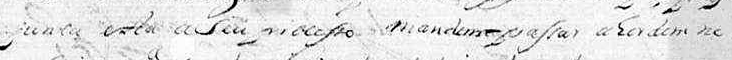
junta esta a seu processo mandamos passar a hordem ne
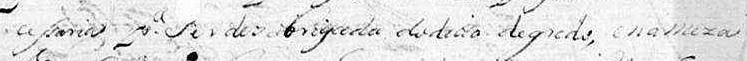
cessaria pa ser desobrigada do ditto degredo, e na meza
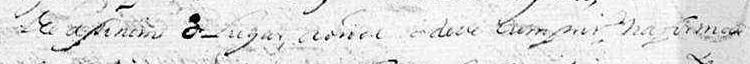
lhe assinem o Lugar aonde deue Cumprir na forma
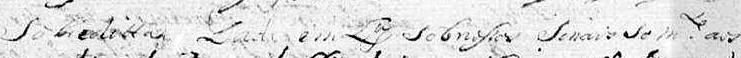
sobreditta Dada em Lxa sob nossos sinais som.te aos
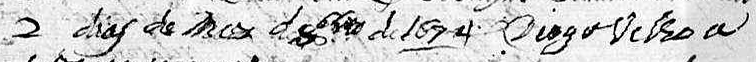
2 dias de mez de 8.bro de 1674. Diogo Velho a
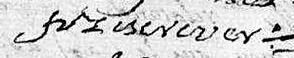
fiz escrever
